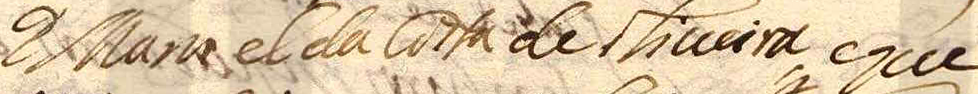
E Manoel da Costa de oliueira, e que
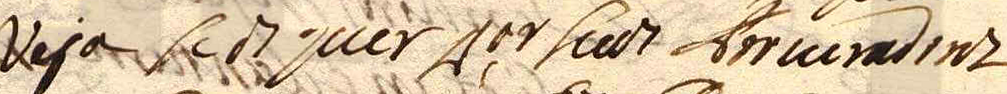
veja se os quer por seus Porcuradorez
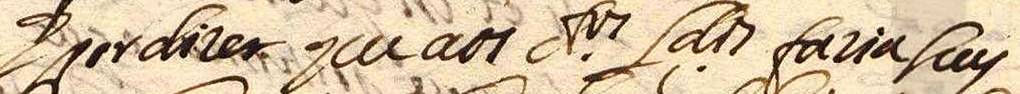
E por dizer que aos d.tos Ld.os fazia seus
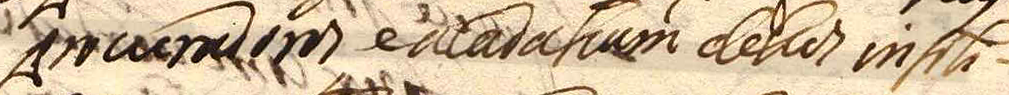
procuradores, e a cada hum delles insoli
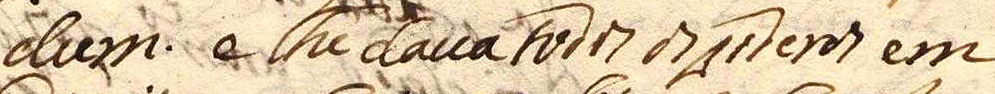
dum. e lhe daua todos os poderes em
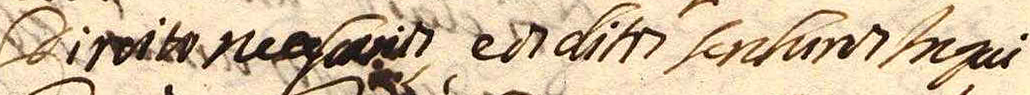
direito necessarios, e os ditos senhores Inqui
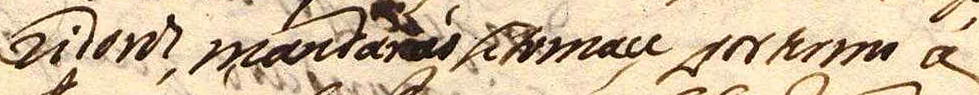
zidores, mandaraõ se tomace por termo a
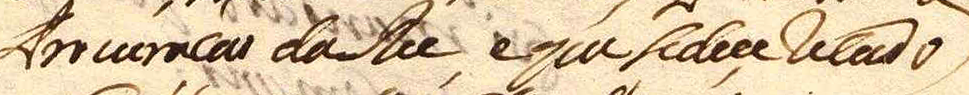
Procuraçaõ da Ree, e que se dece Recado
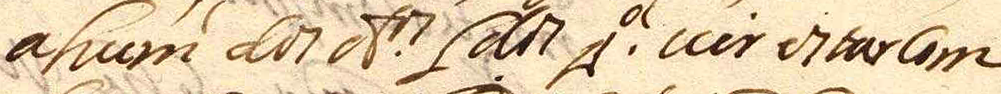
a hum dos dt̄.os L.dos p.a uir estar com
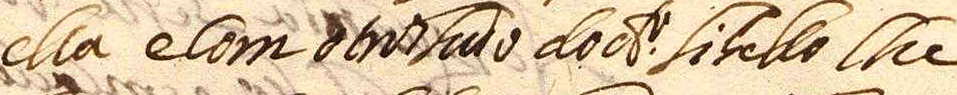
ella e com o treslado do dt̄.o libello lhe
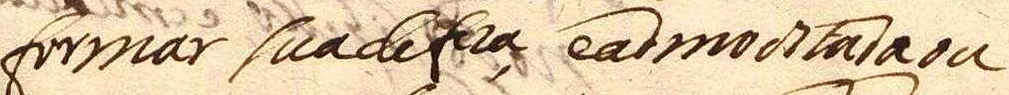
formar sua defeza, e admoestada ou
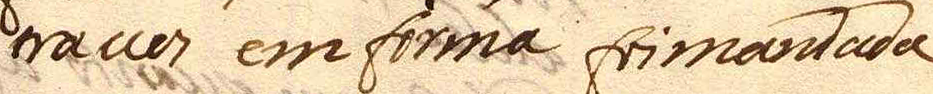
tra uez em forma foi mandada
